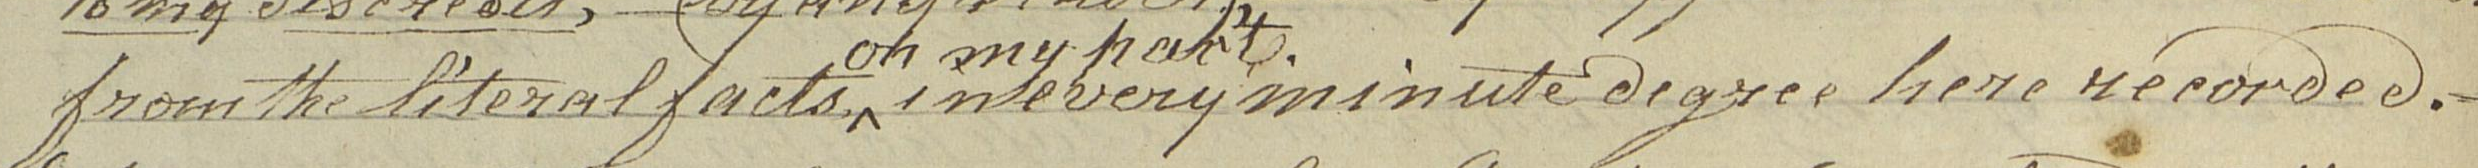from the literal facts ^ in every minute degree here recorded.
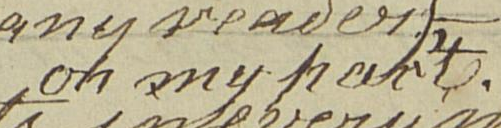on my part.
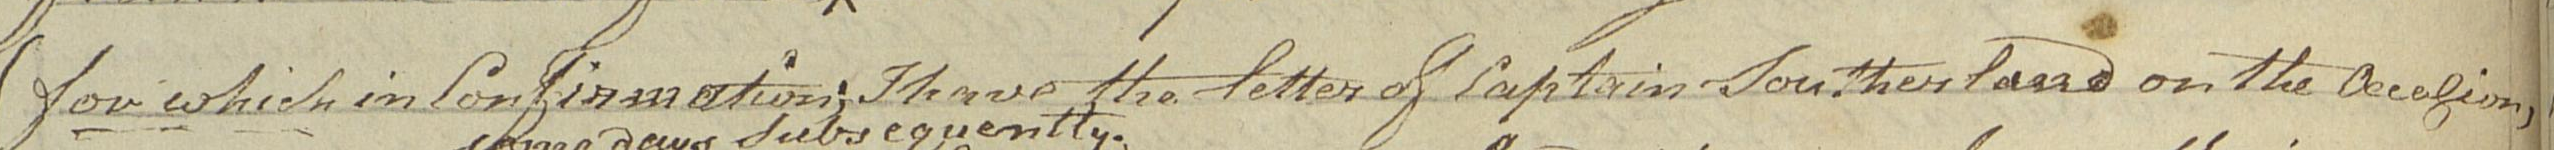(for which in Confirmation; I have the letter of Captoin Southerland on the Occasion,
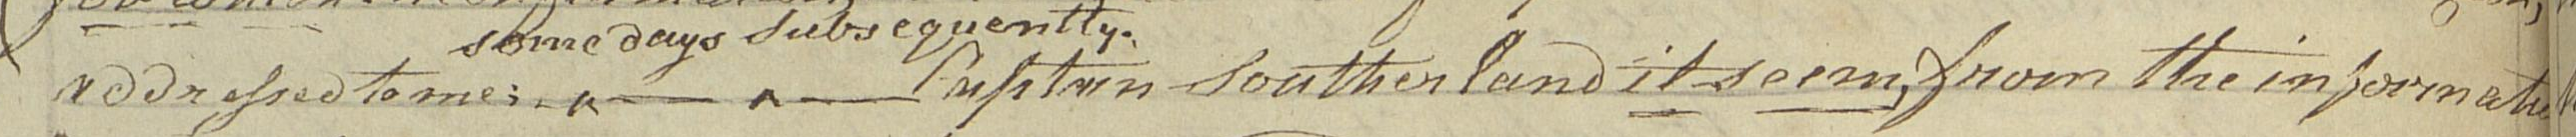addressed to me: ^ ^ Captain Southerland it seem, from the information
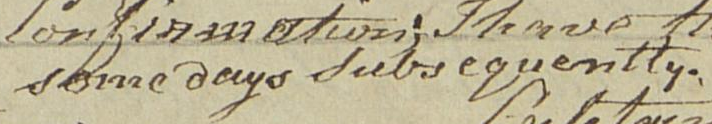some days Subseqpently.
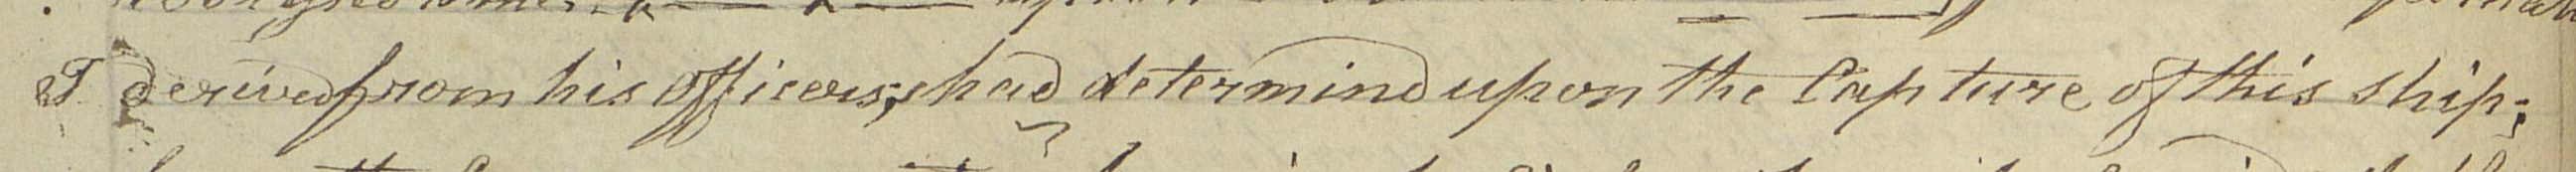I derived from his officers; had determind upo the Capture of this ship;
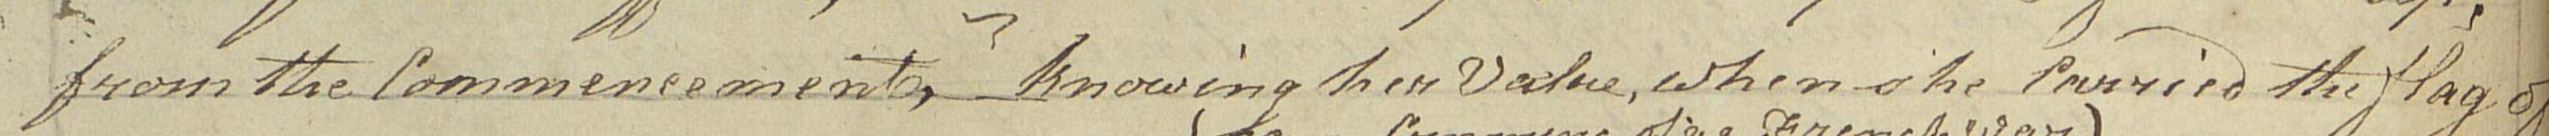from the Commencement, knowing her Value, when she carried the falg of
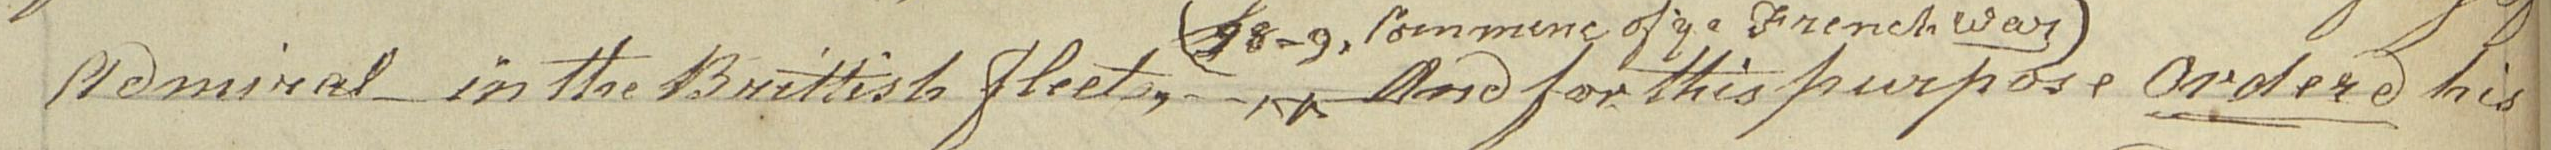Admiral in the Brittish fleet, ^ ^ And for this purpose Orderd his
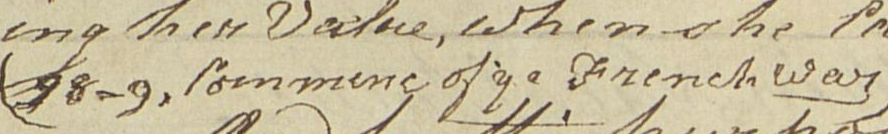(98-9, Commence of ye French War)
